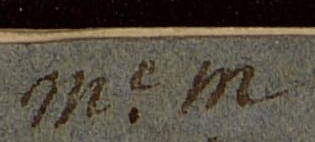M^l. M
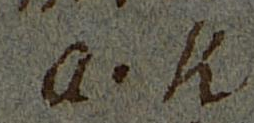A. K
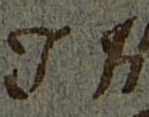J H
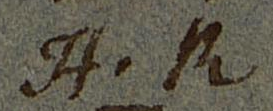H. R
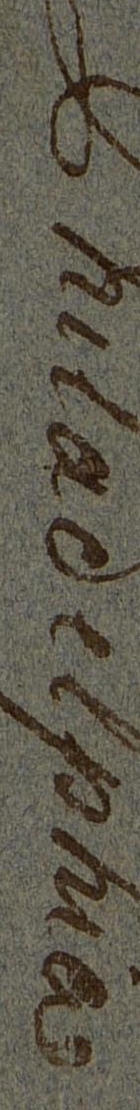Philadelphia
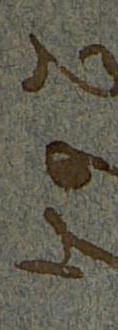264
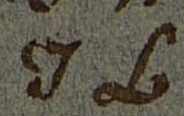T L
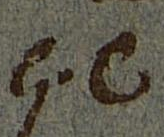G. C
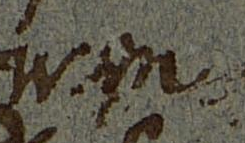W. M
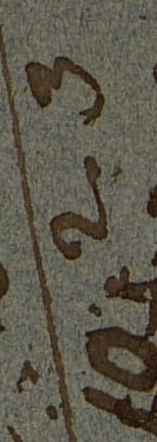10.2.3
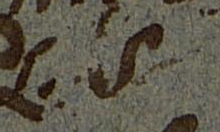l. s
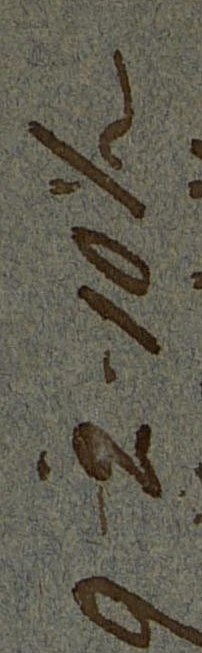9 - 2 - 10 1/2
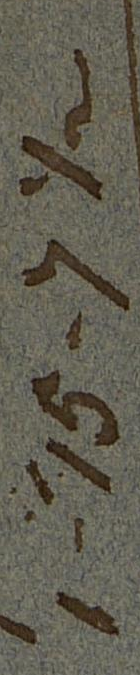1-15-7 1/2
